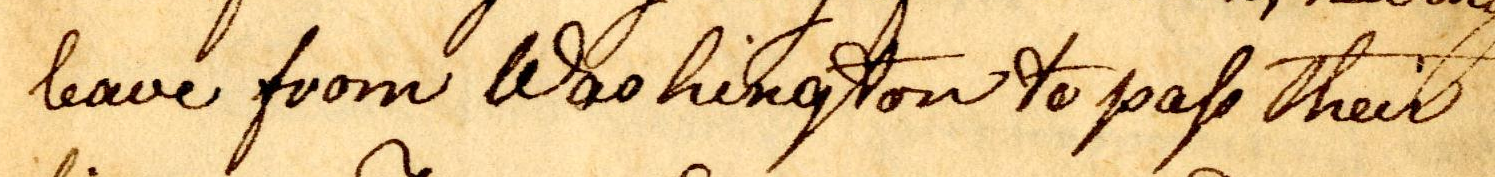leave from Washington to pass their
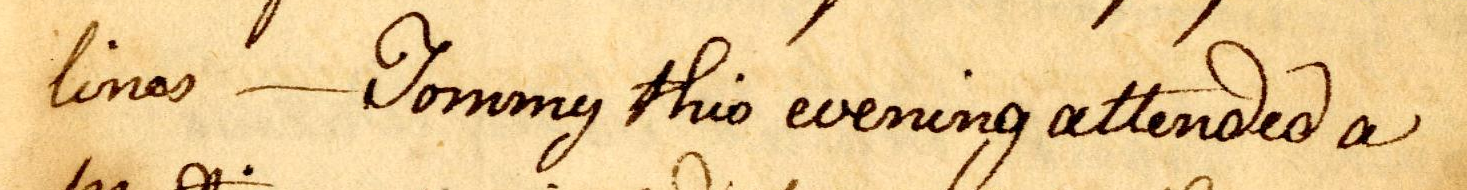lines- Tommy this evening attended a
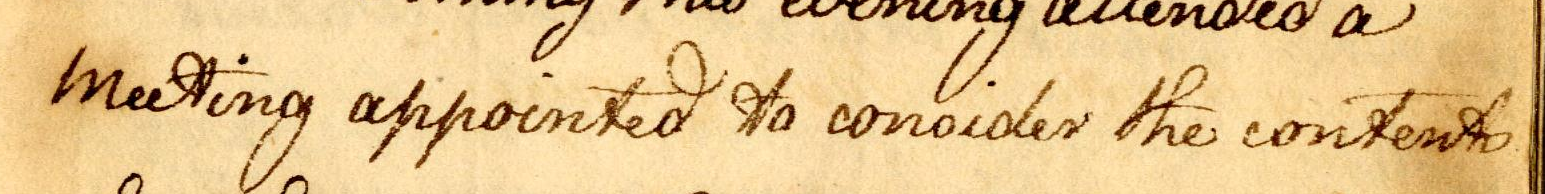Meeting appointed to consider the contents
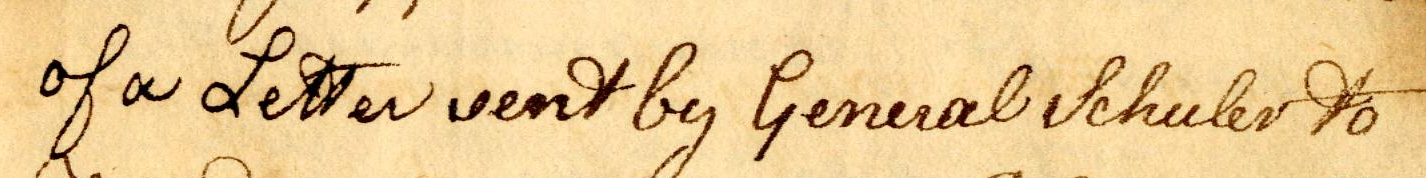of a Letter sent by General Schuler to
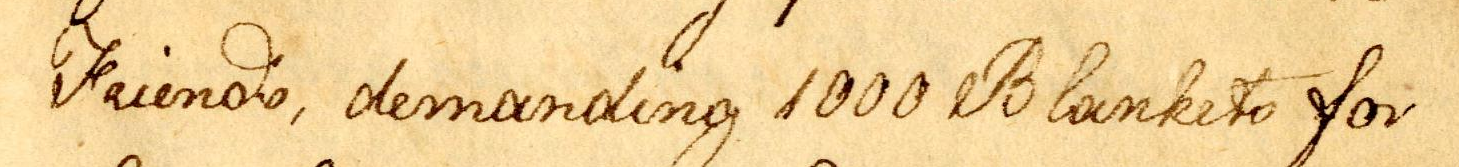Friends, demanding 1000 Blankets for
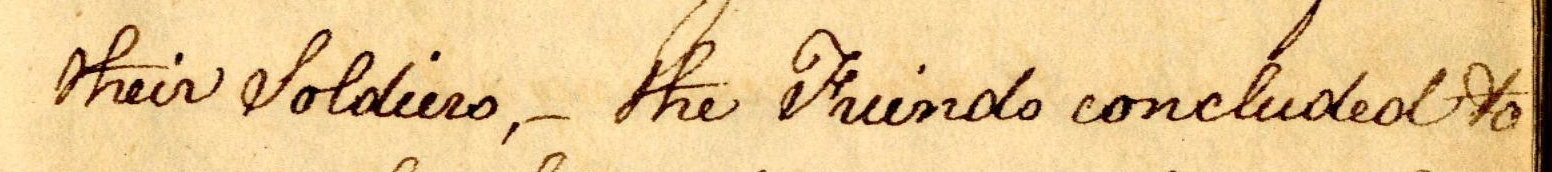their Soldiers,- the Friends concluded to
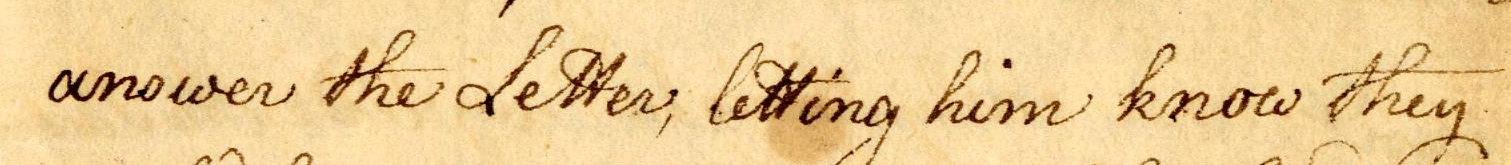answer the Letter, letting him know they
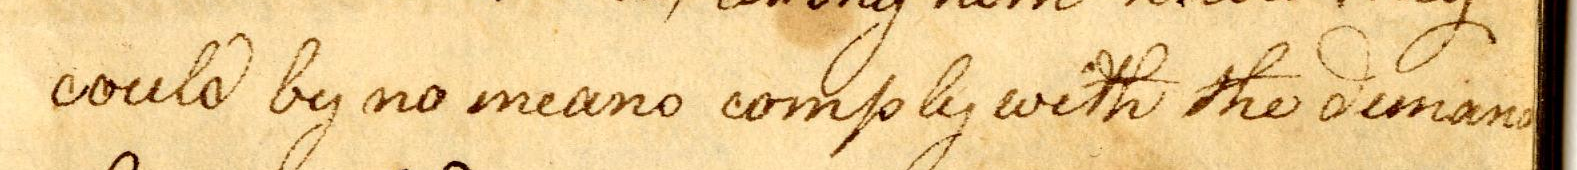could by no means comply with the demand
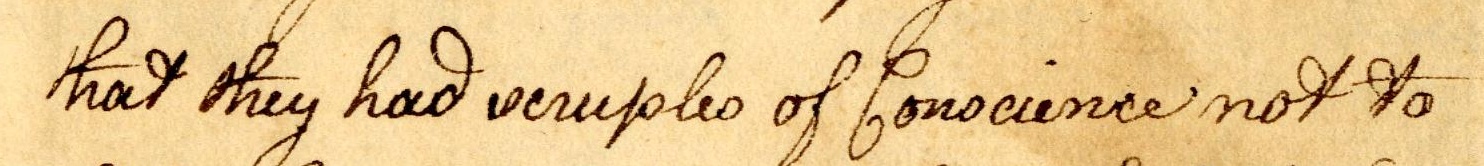that they had scruples of Conscience not to
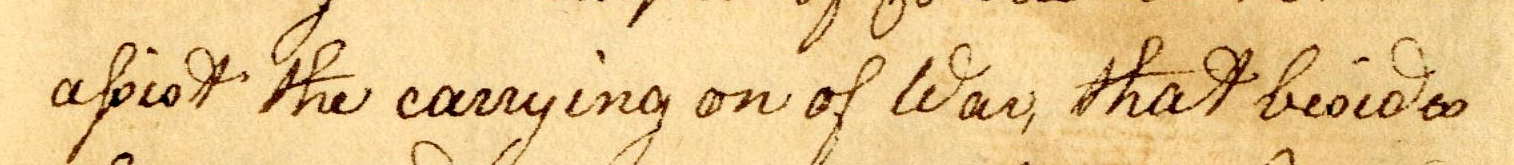assist the carrying on of War, that besides
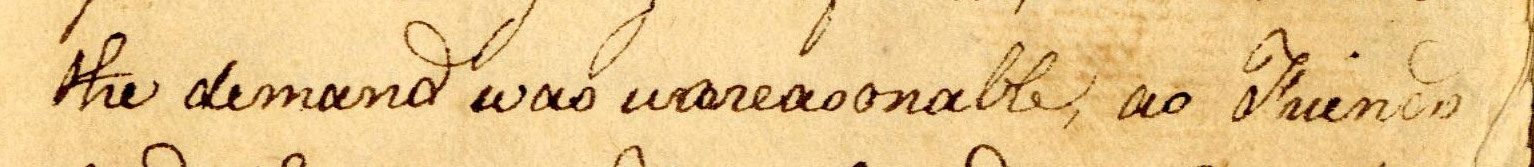the demand was unreasonable, as Friends
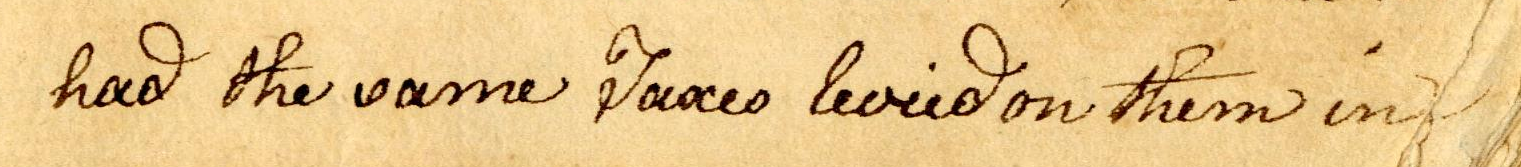had the same Taxes levied on them in
